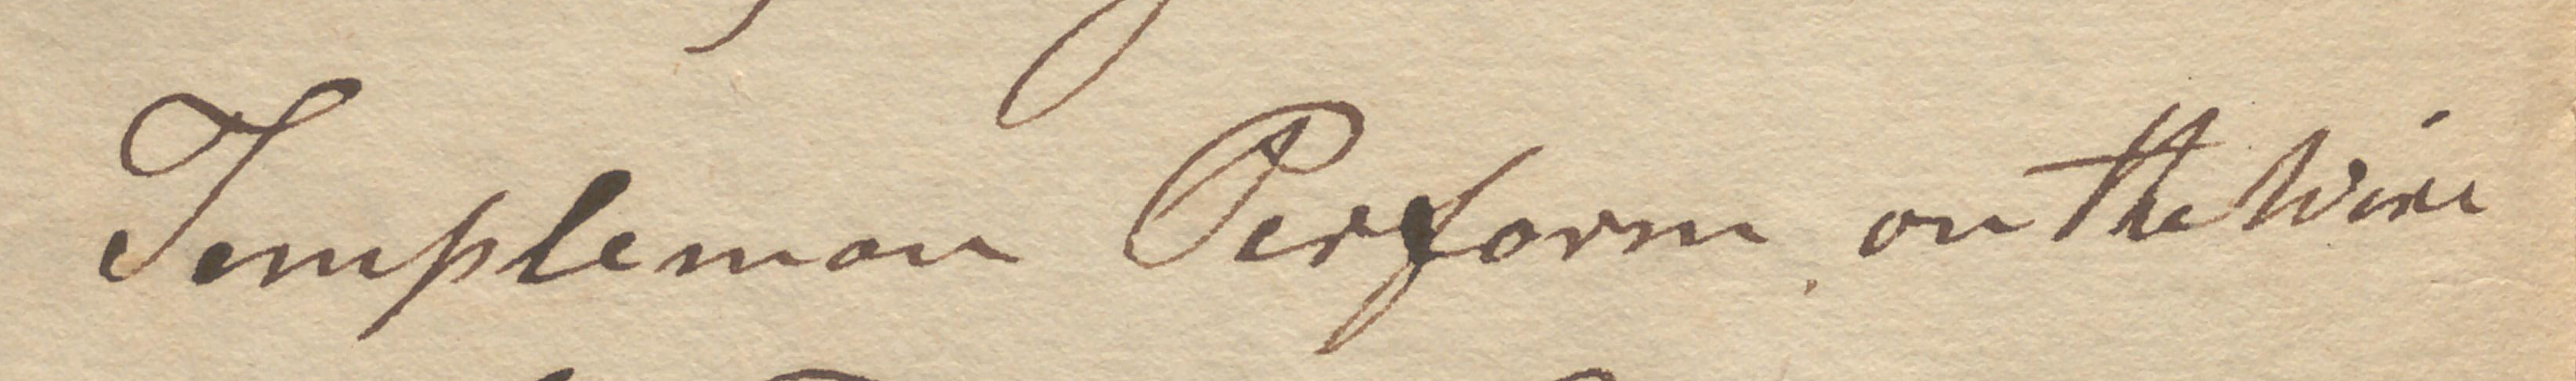Templeman Perform on the wire
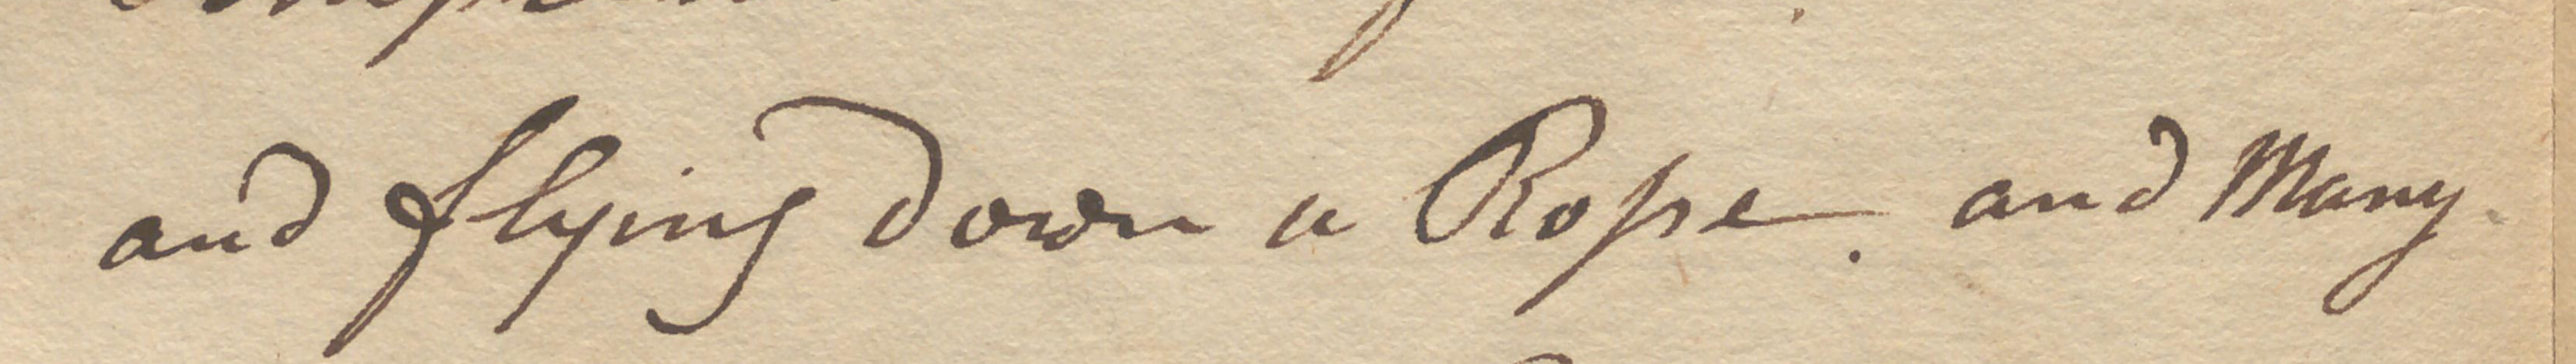and flying down a Rope. and Many
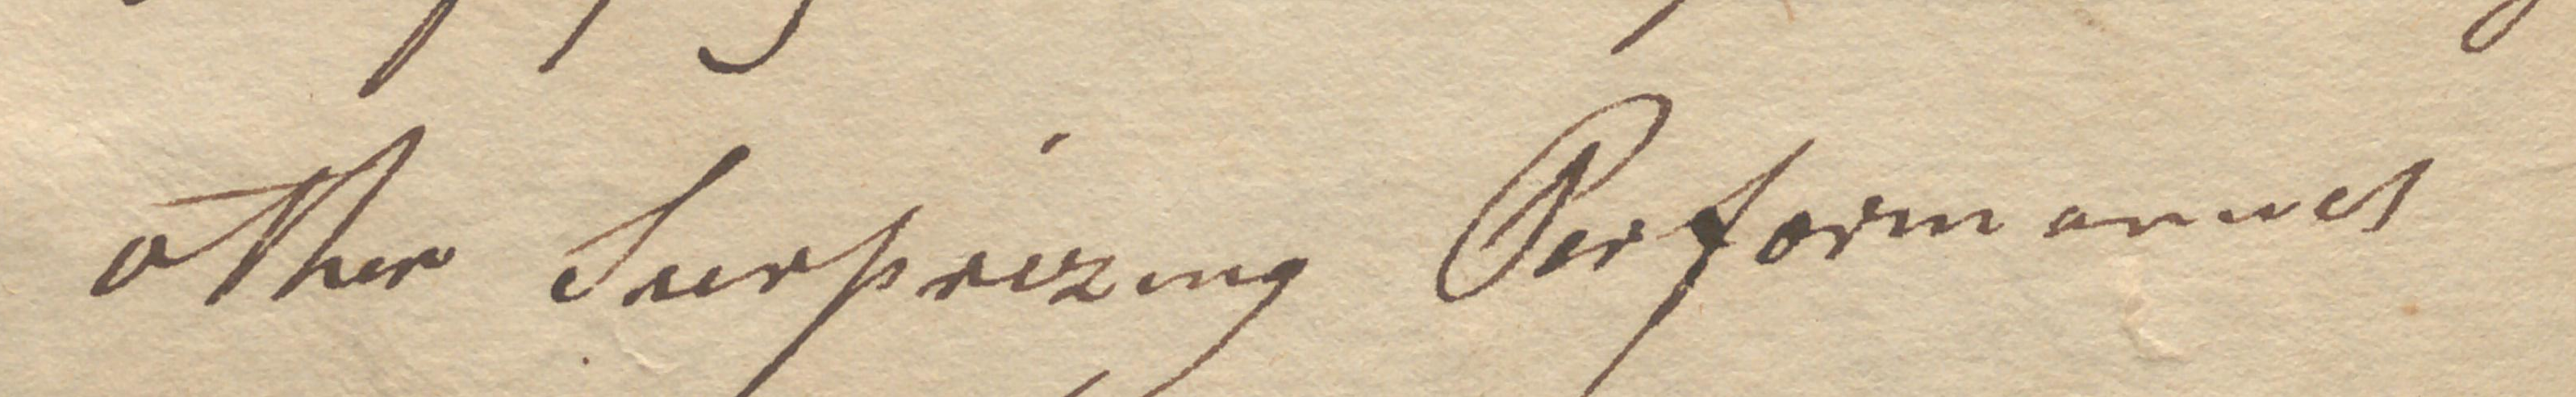other Surprizing Performances
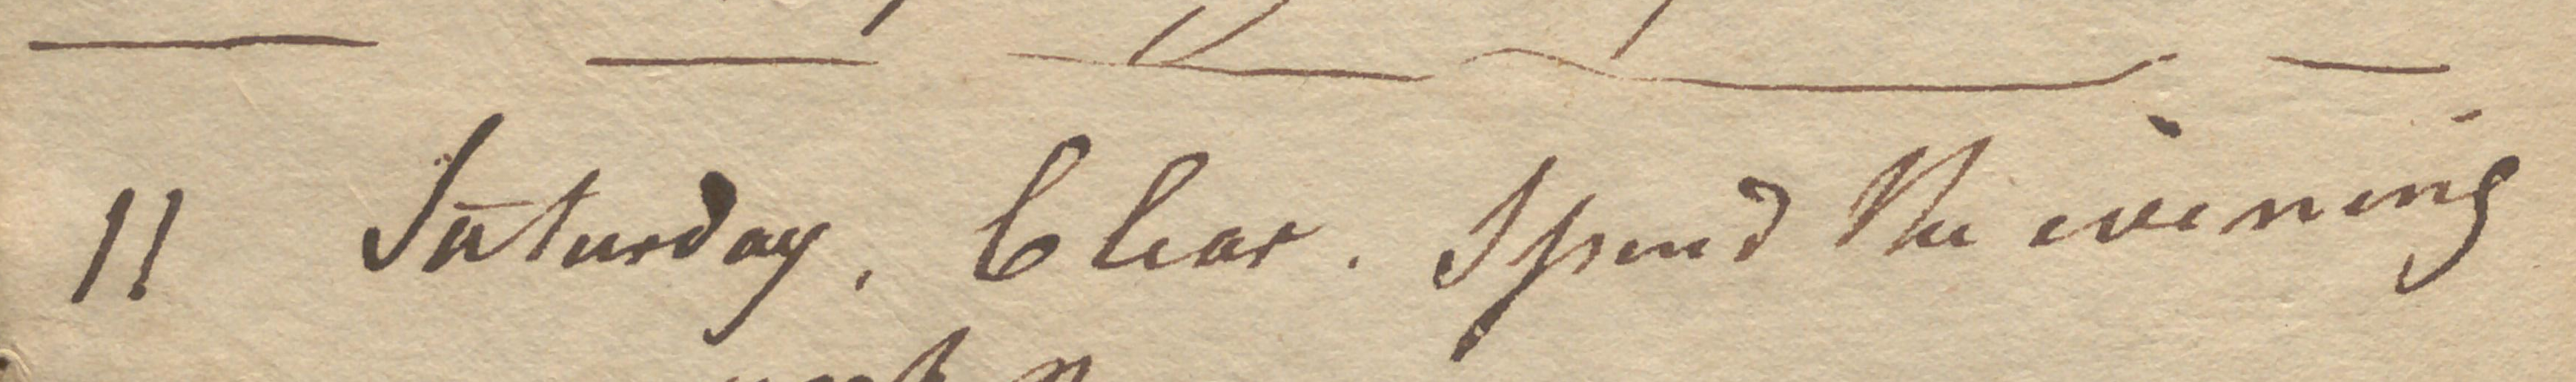11 Saturday, Clear. spend the evening
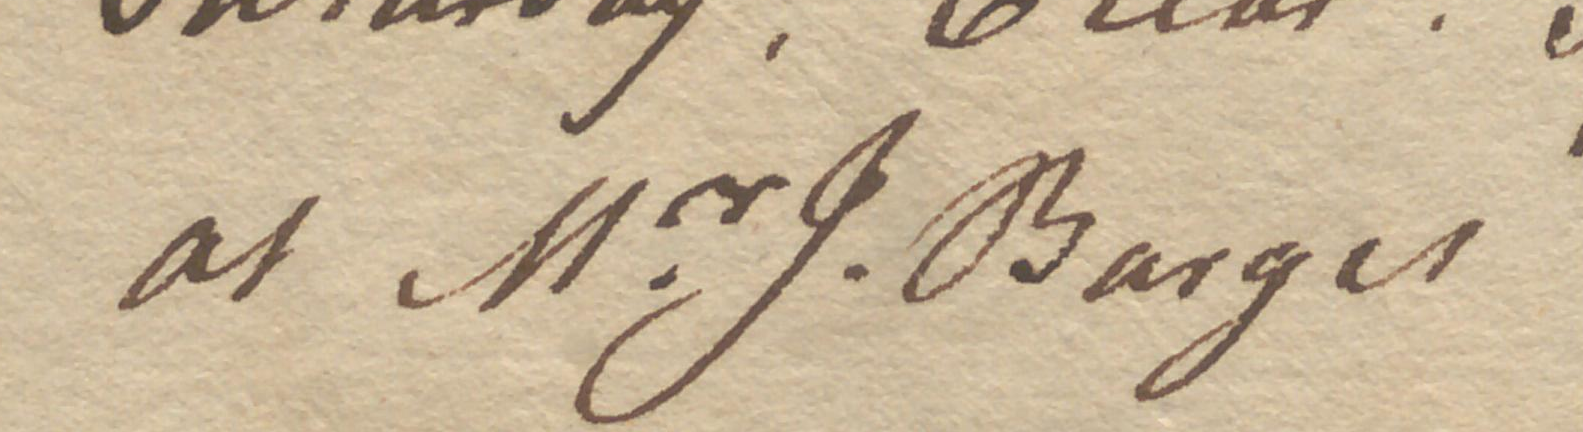at M^r. J. Barges
